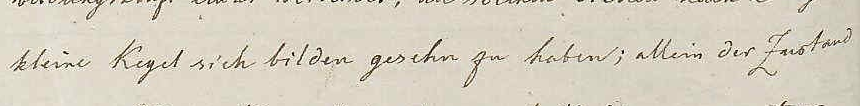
kleine Kegel sich bilden gesehn zu haben; allein der Zustand
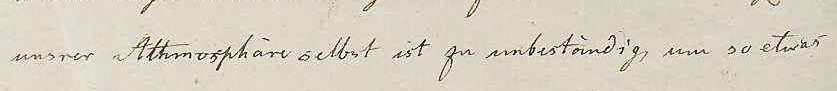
unsrer Athmosphäre selbst ist zu unbeständig, um so etwas
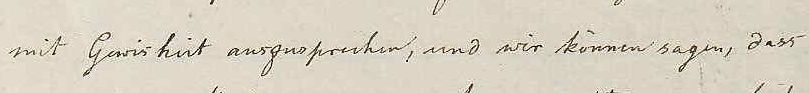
mit Gewisheit auszusprechen, und wir können sagen, dass
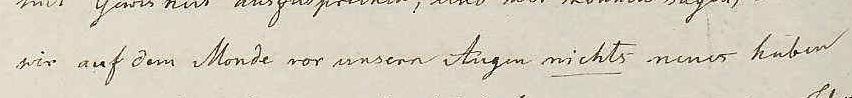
wir auf dem Monde vor unsern Augen nichts neues haben
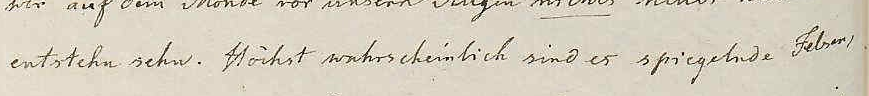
entstehn sehn. Höchst wahrscheinlich sind es spiegelnde Felsen,
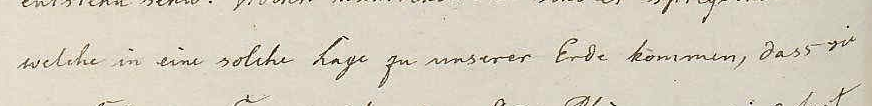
welche in eine solche Lage zu unserer Erde kommen, dass sie
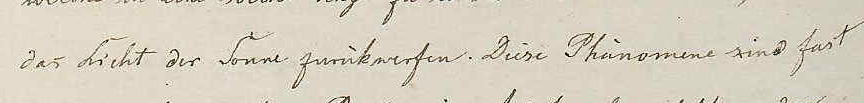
das Licht der Sonne zurükwerfen. Diese Phänomene sind fast
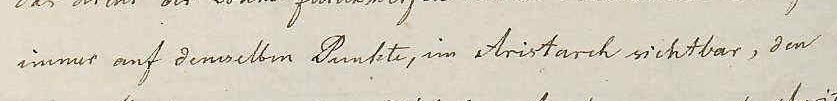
immer auf demselben Punkte, im Aristarch sichtbar, den
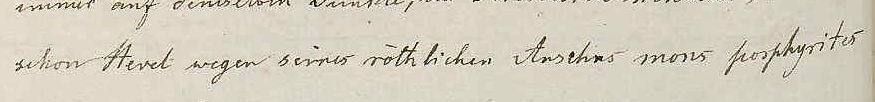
schon Hevel wegen seines röthlichen Ansehns mons porphyrites
